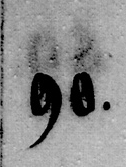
Ms.
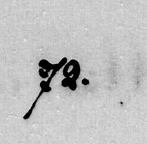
31.
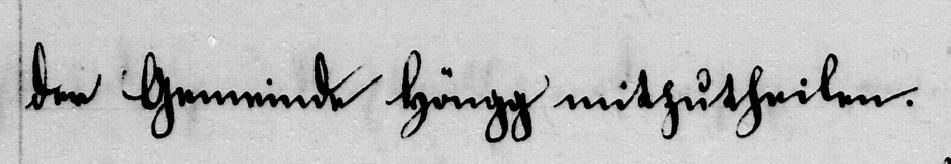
der Gemeinde Höngg mitzutheilen.
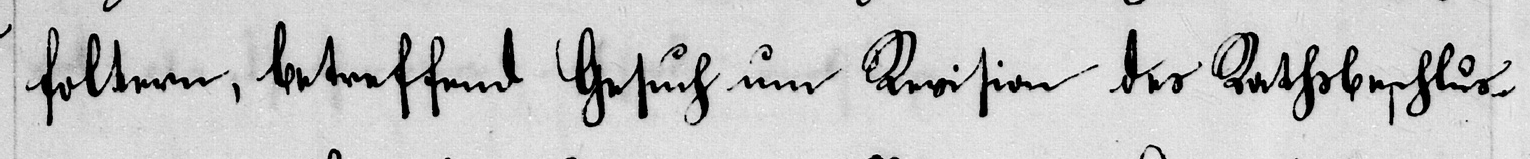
foltern, betreffend Gesuch um Revision des Rathsbeschluß¬
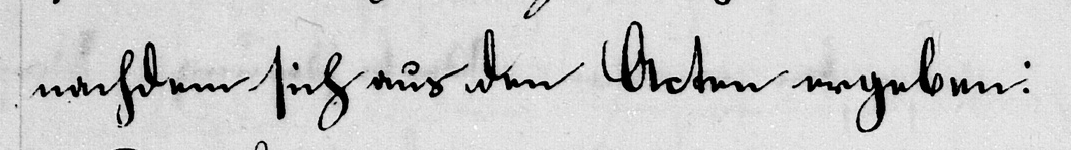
nachdem sich aus den Acten ergeben:
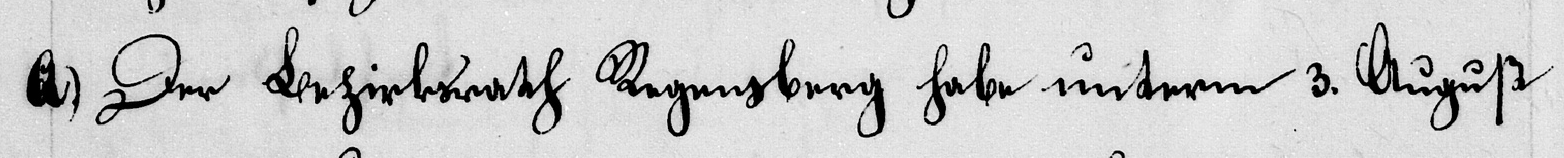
A.) Der Bezirksrath Regensberg habe unterm 3. August
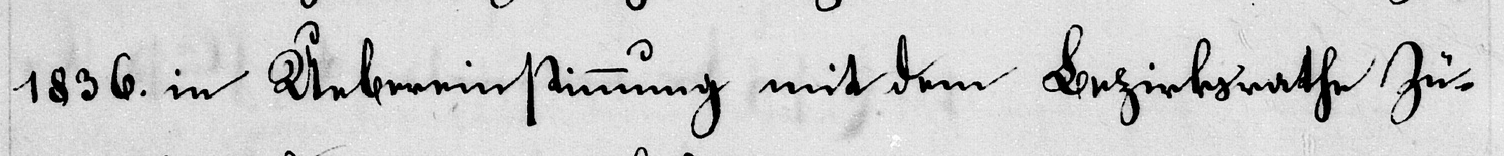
1836. in Uebereinstimmung mit dem Bezirksrathe Zü¬
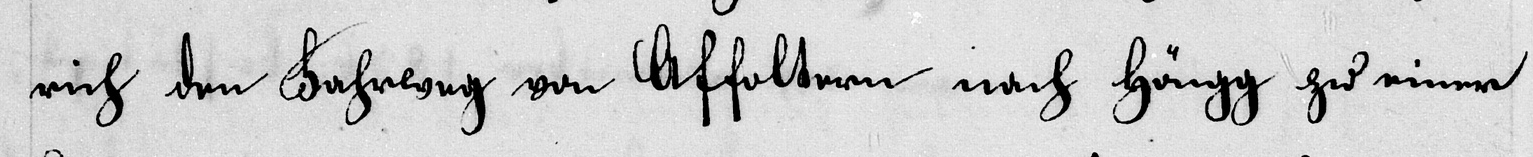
rich den Fahrweg von Affoltern nach Höngg zu einer
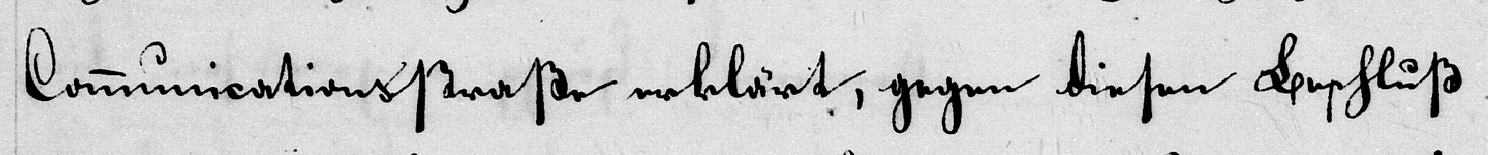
Communicationsstraße erklärt, gegen diesen Beschluß
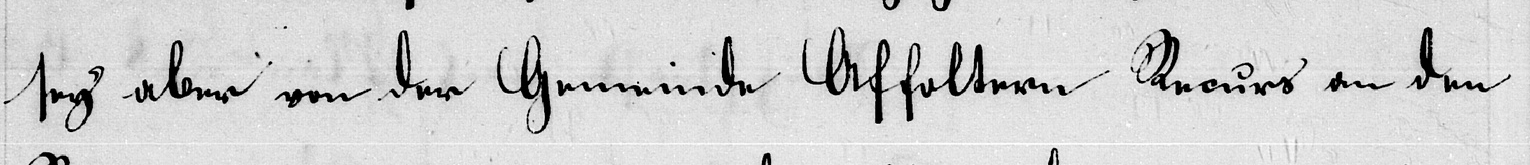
sey aber von der Gemeinde Affoltern Recurs an den
